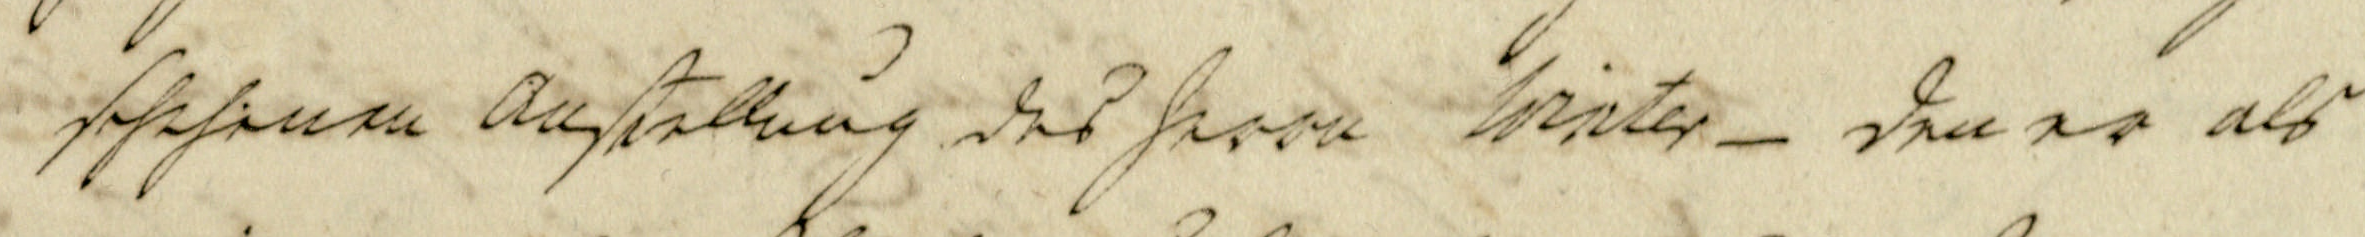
schehenen Anstellung des Herrn Winter den er als
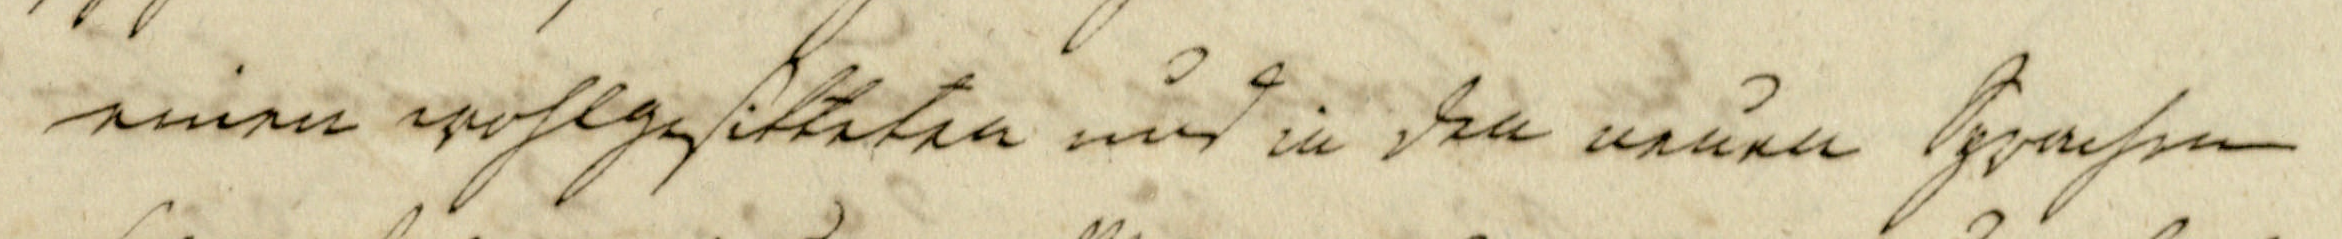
einen wohlgesitteten und in den neuen Sprachen
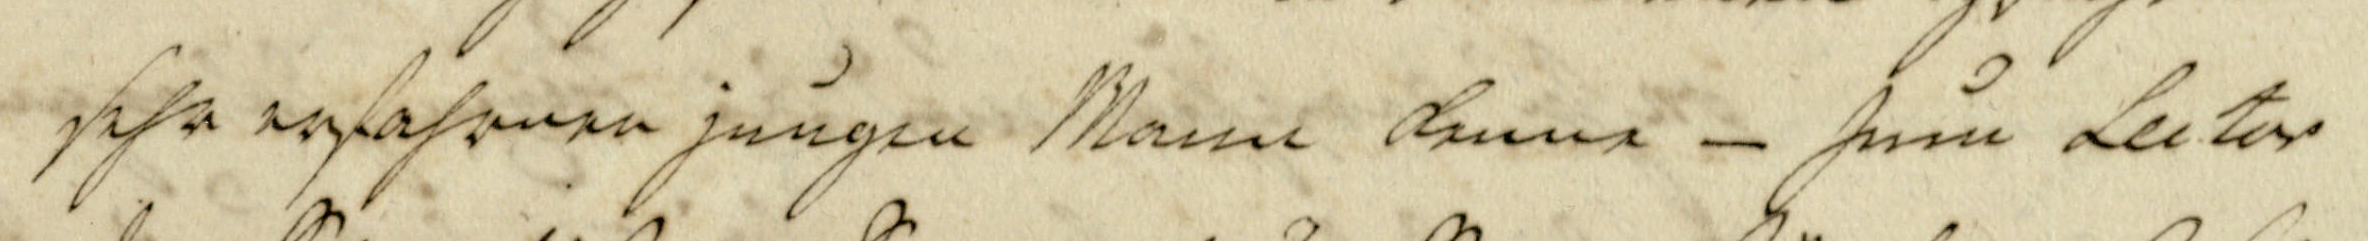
sehr erfahrnen jungen Mann kenne zum Lector
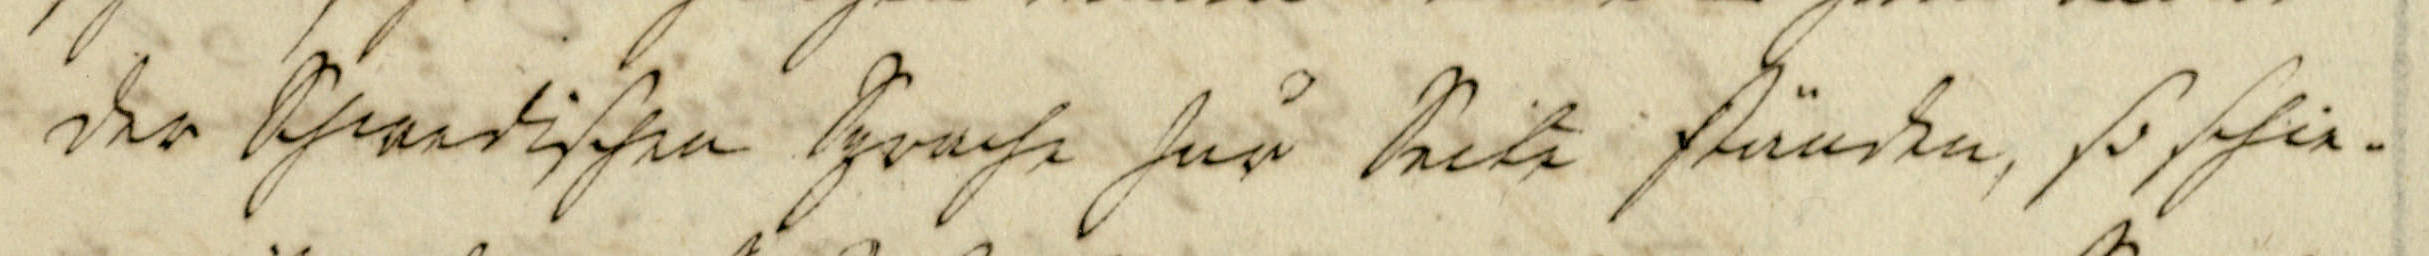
der Schwedischen Sprache zur Seite ständen, so schie¬
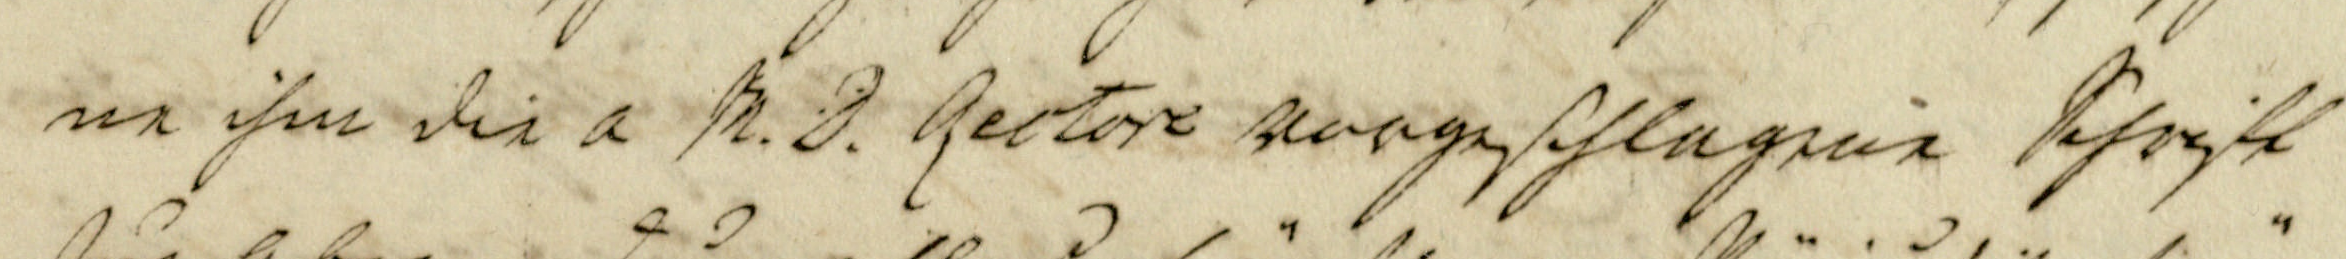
ne ihm die a M. D. Rectore vorgeschlagene Schrift
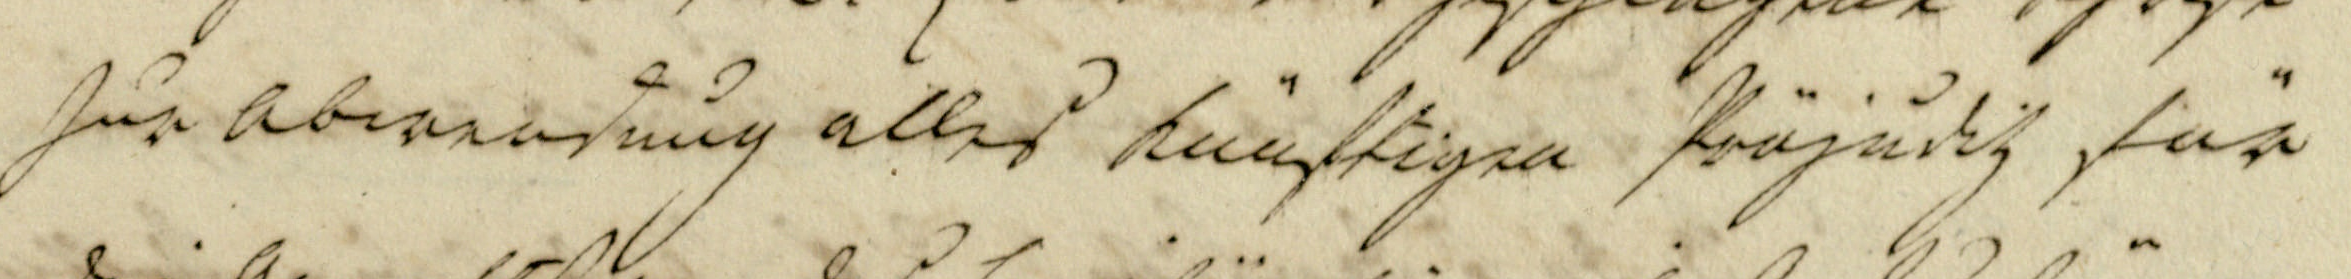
zur Abwendung aller künftigen Präjudiz für
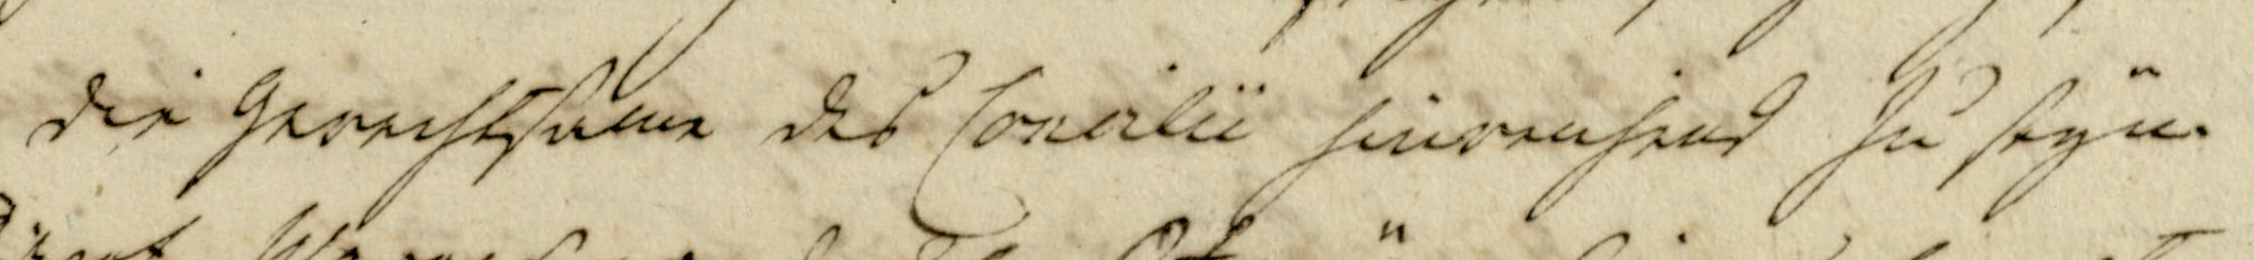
die Gerechtsame des Concilii hinreichend zu seÿn.
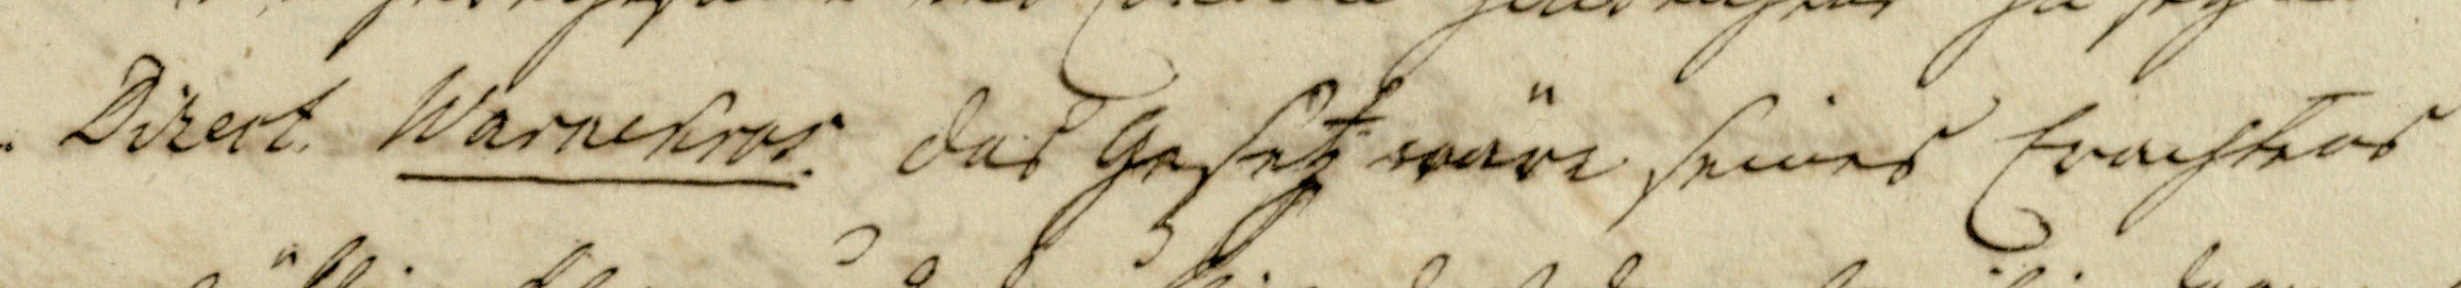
Direct. Warnekros. Das Gesuch wäre seines Erachtens
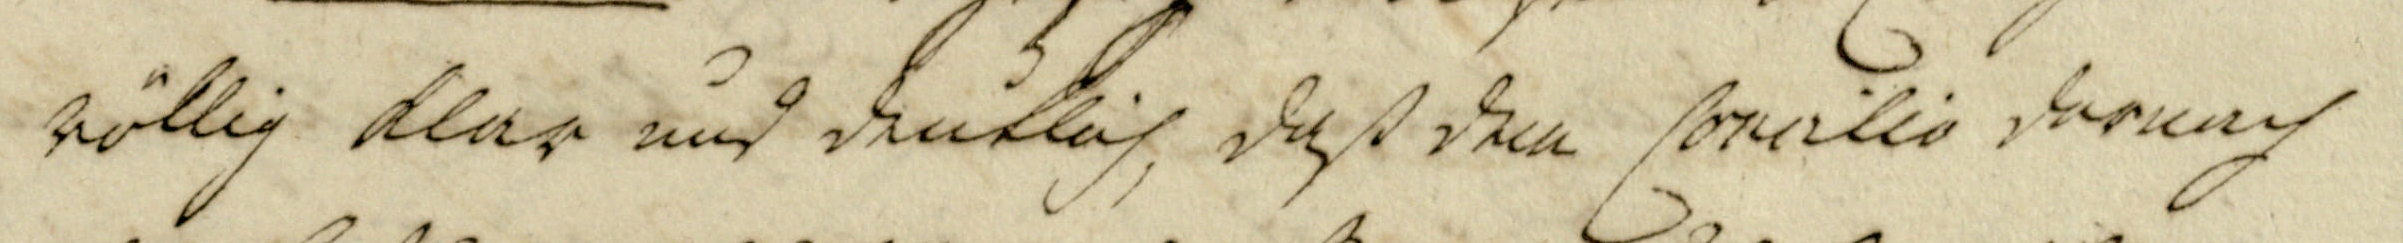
völlig klar und deutlich, daß dem Concilio darnach
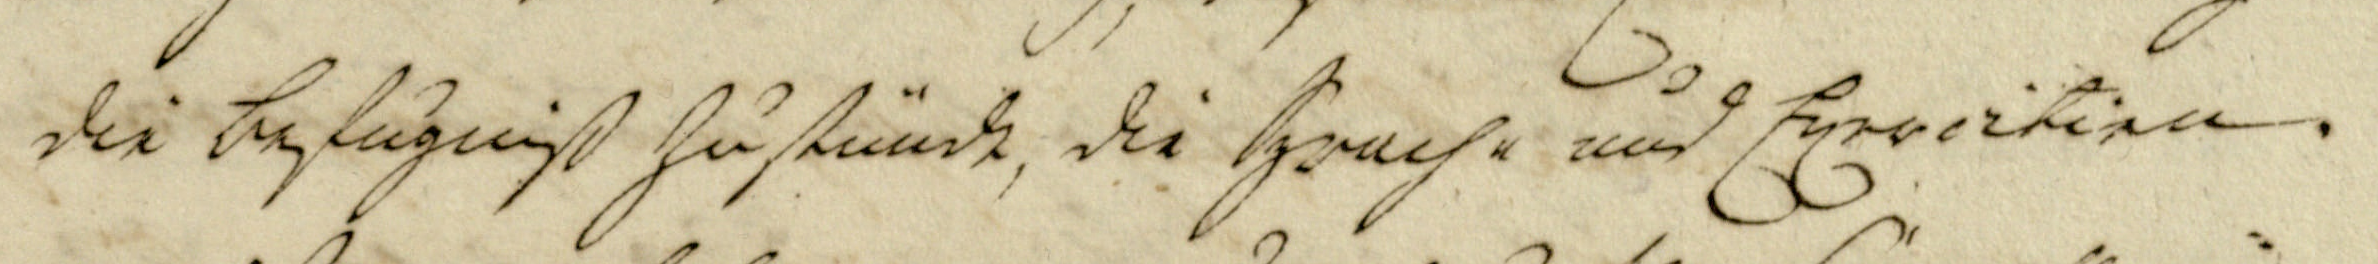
die Befugniß zustünde, die Sprach- und Exercitien¬
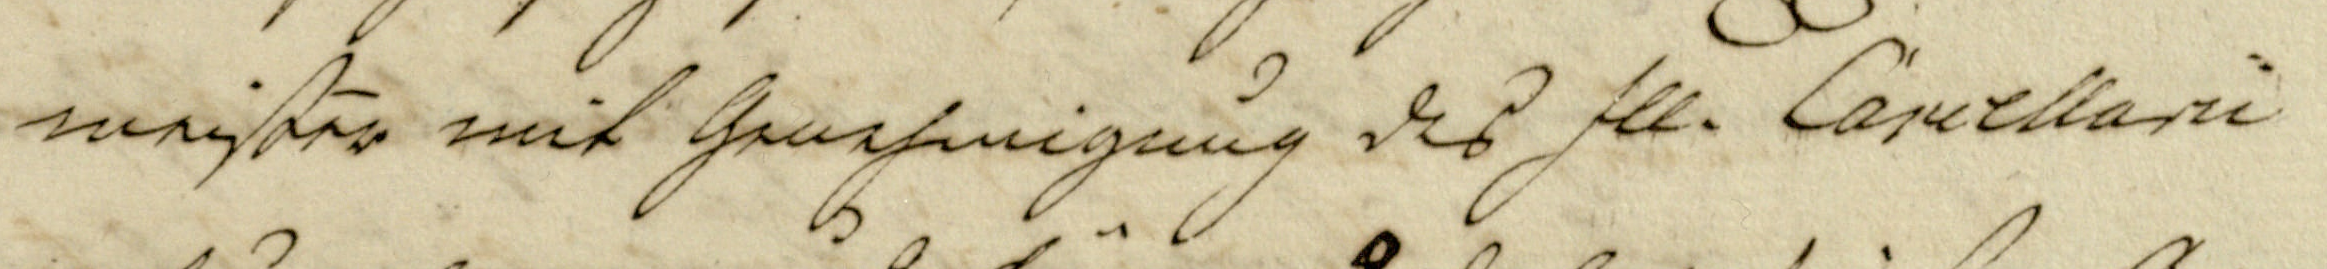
meister mit Genehmigung des Ill. Cancellarii
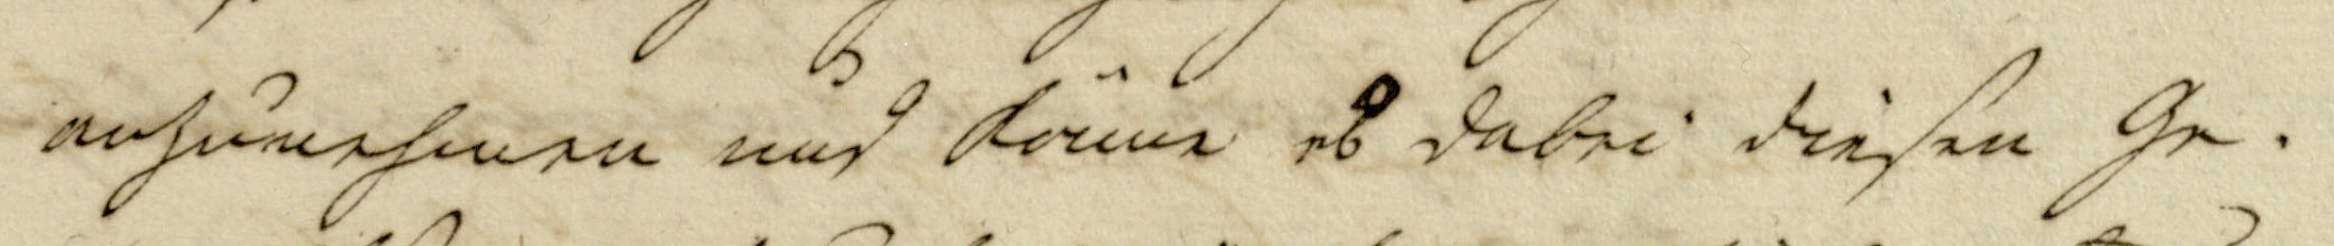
anzunehmen und könne es dabei diesen Ge¬
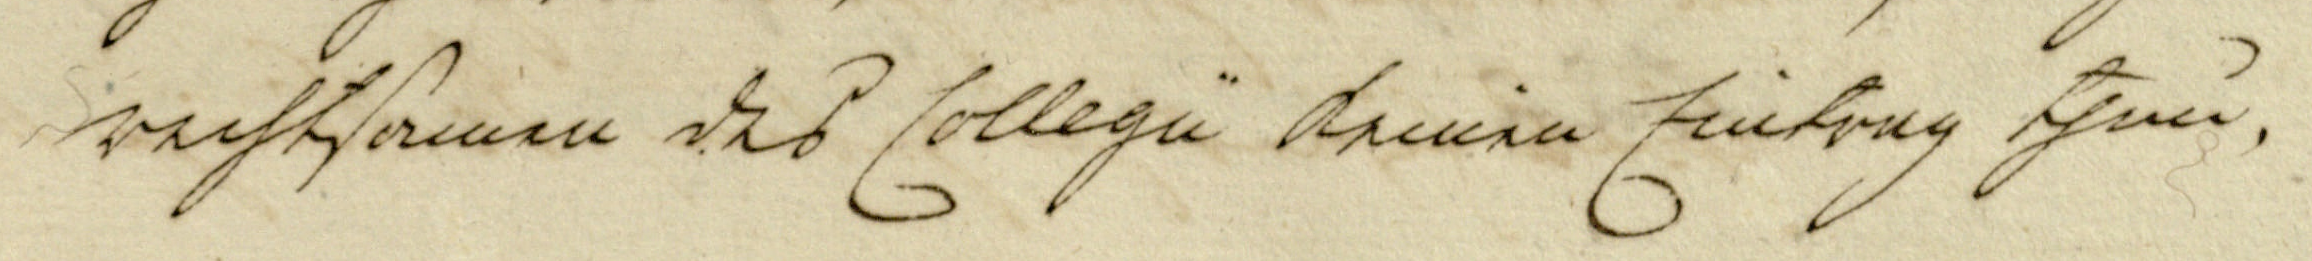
rechtsamen des Collegii keinen Eintrag thun,
